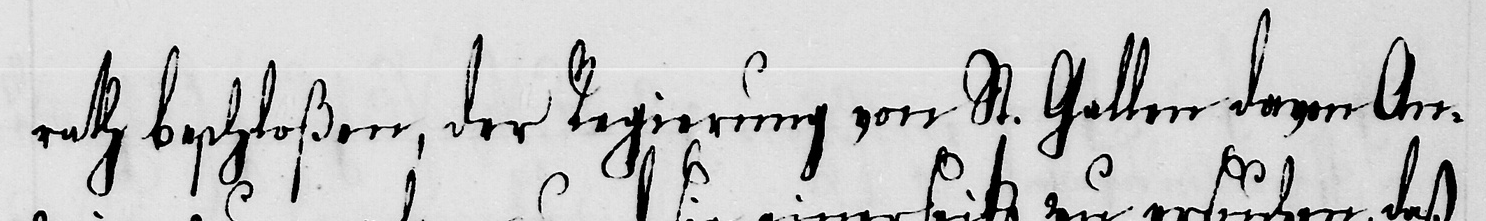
rath beschloßen, der Regierung von St. Gallen davon An¬
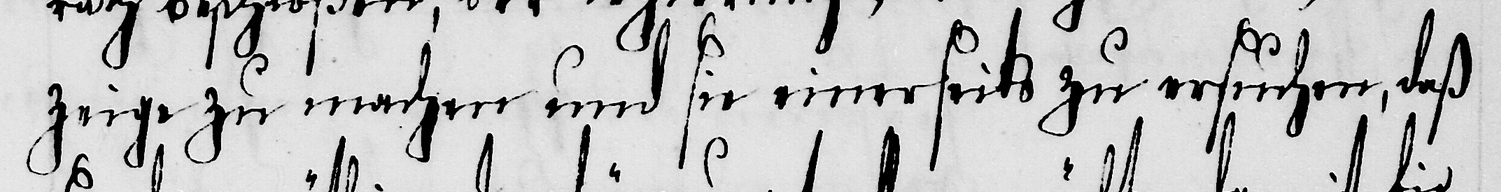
zeige zu machen und sie einerseits zu ersuchen, daß
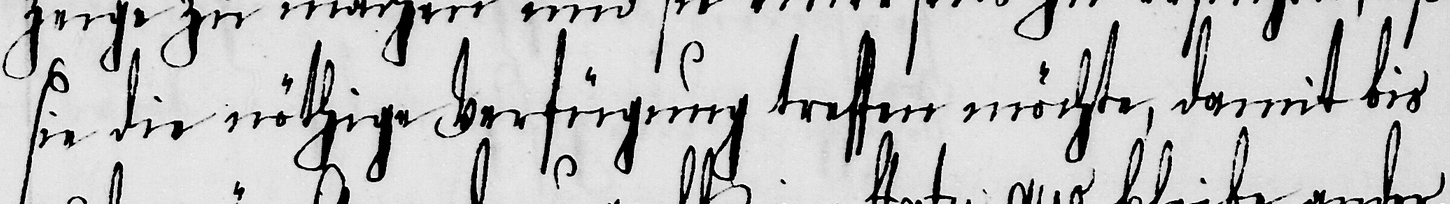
sie die nöthige Verfügung treffen möchte, damit bis
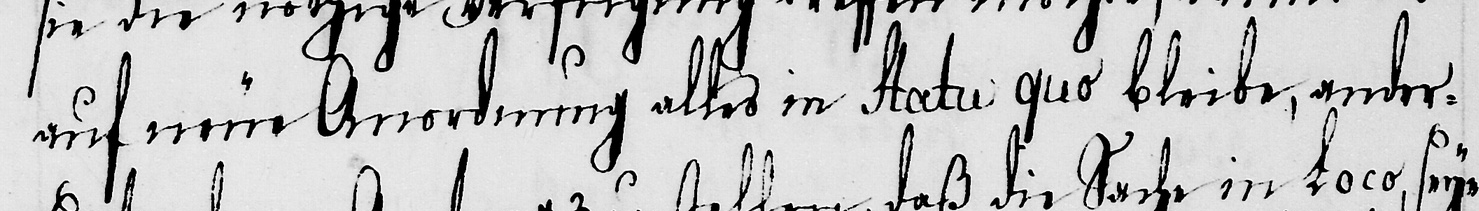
auf neue Anordnung alles in Statu quo bleibe, ander¬
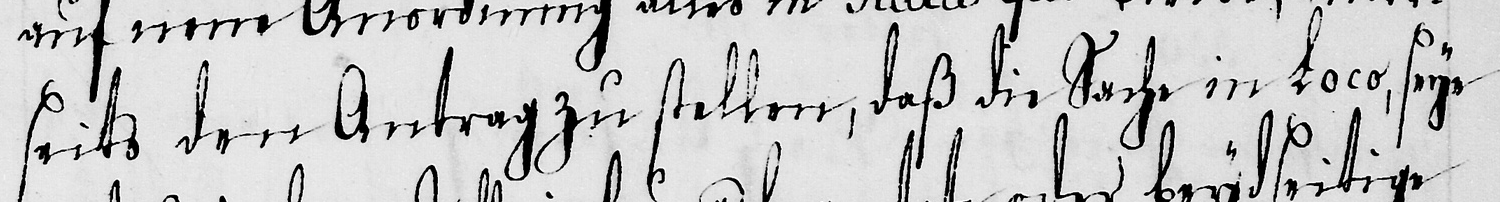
seits den Antrag zu stellen, daß die Sache in Loco, seye
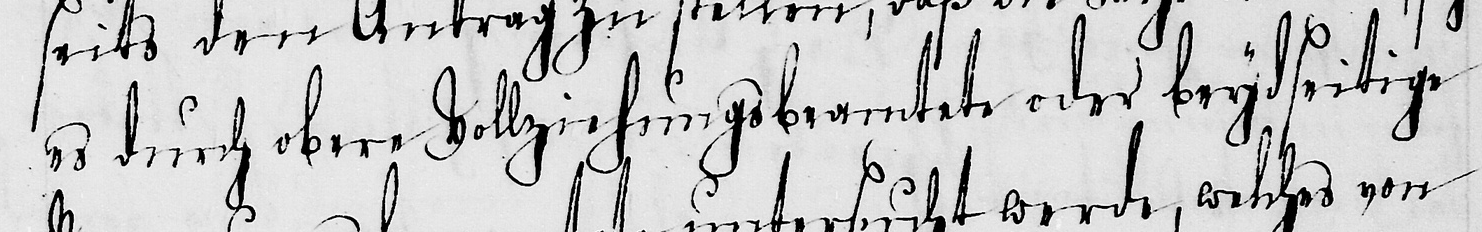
es durch obere Vollziehungsbeamtete oder beydseitige
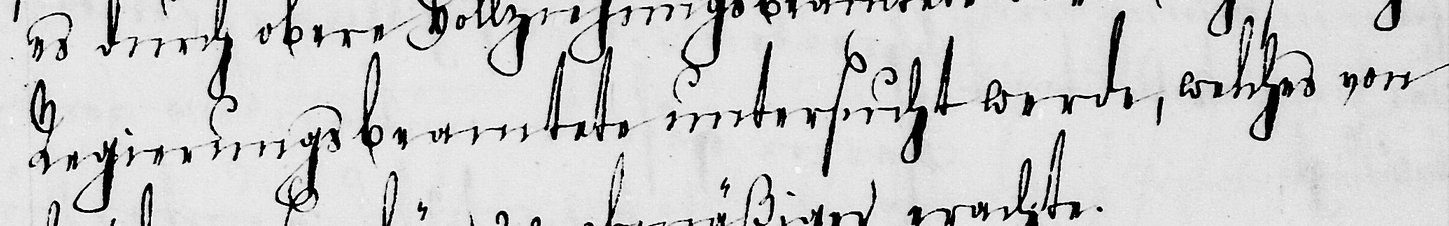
Regierungsbeamtete untersucht werde, welches von
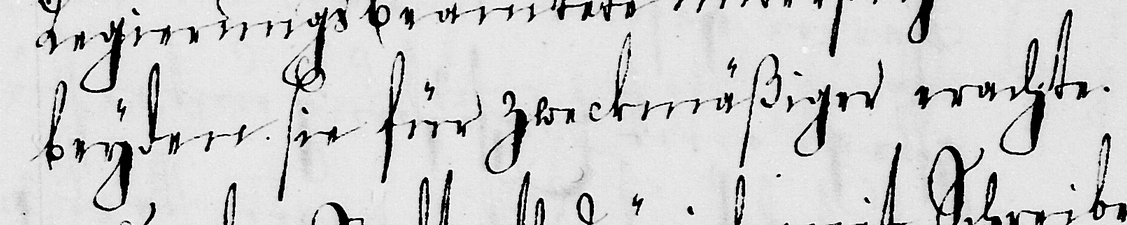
beyden sie für zweckmäßiger erachte.
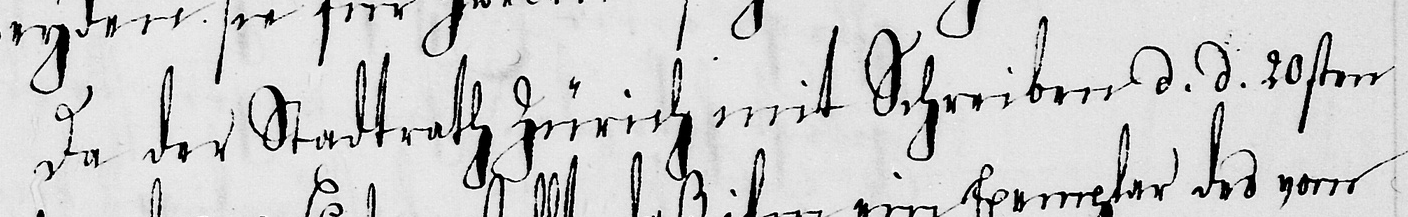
Da der Stadtrath Zürich mit Schreiben d. d. 20sten
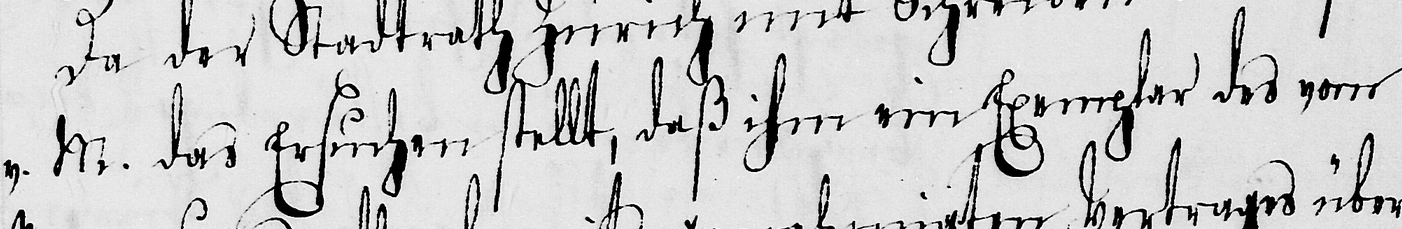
M. das Ersuchen stellt, daß ihm ein Exemplar des vom
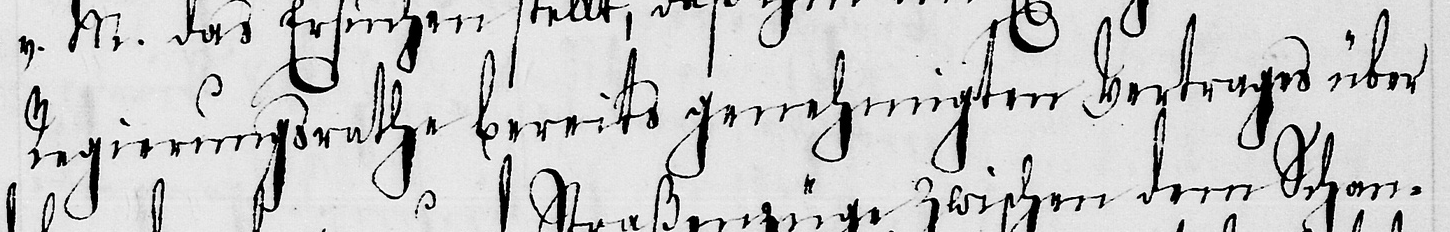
Regierungsrathe bereits genehmigten Vertrages über
